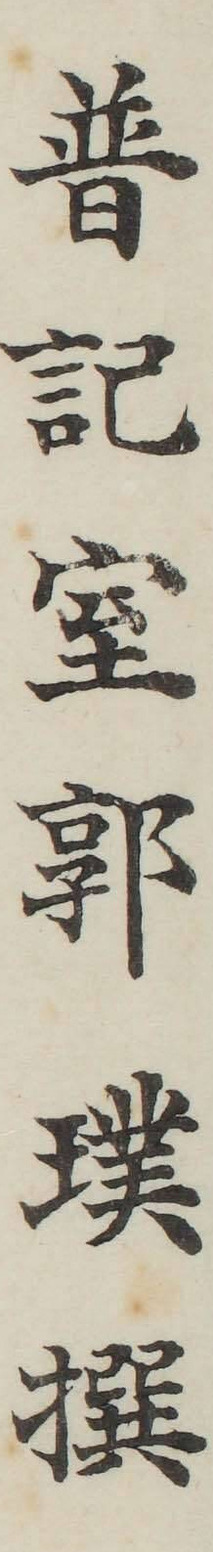普記室郭璞撰
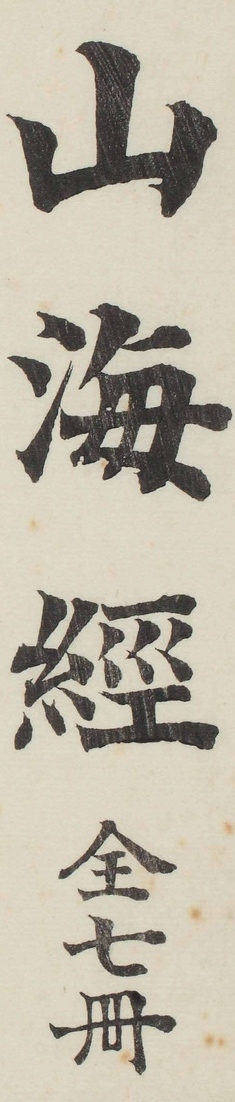山海経全七冊
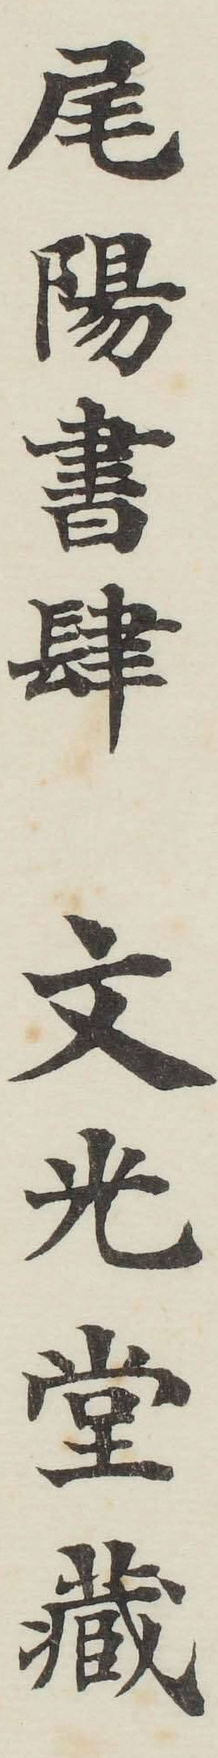尾陽書肆文光堂蔵
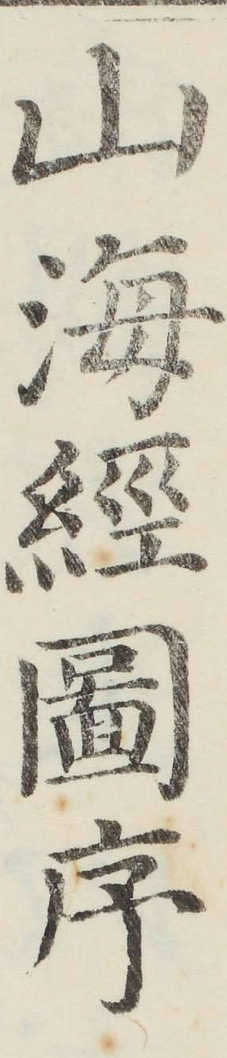山海経図序
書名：山海經
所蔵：国文学研究資料館
